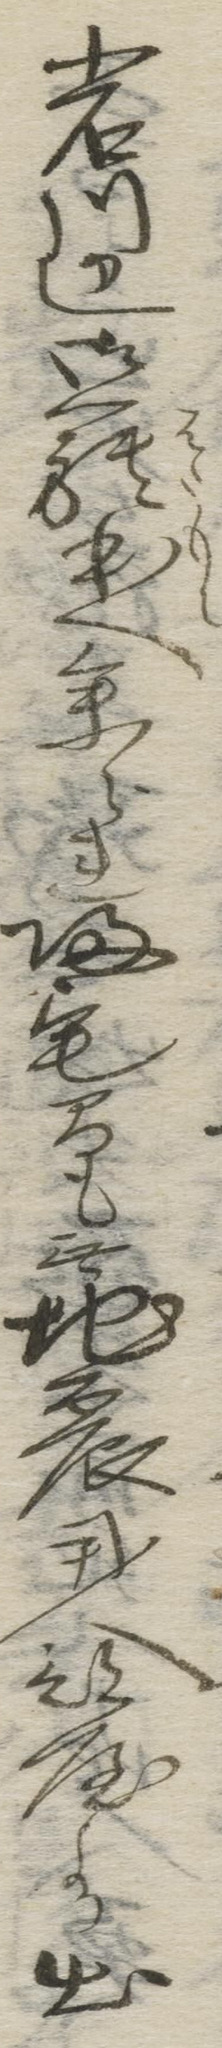小石川辺御旗本へ参られ帰宅間も無地震用人部屋より出
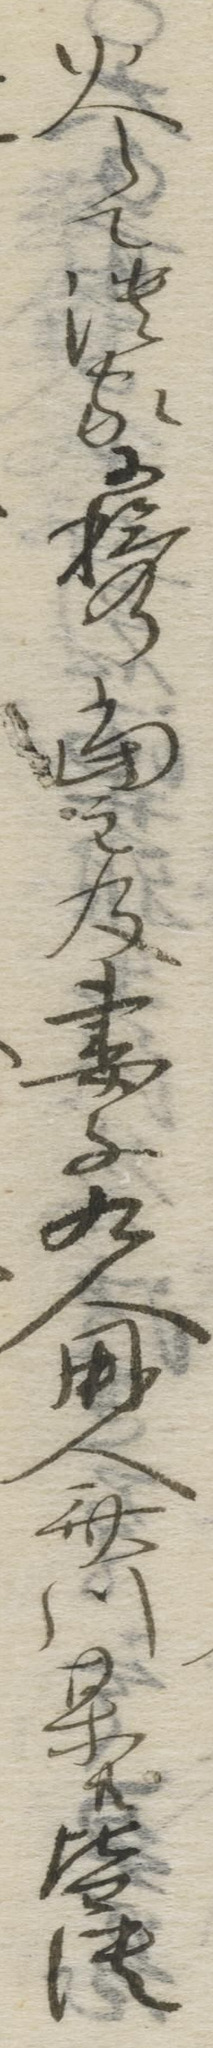火して潰家に移り当主及び妻子九人用人斎川某共皆潰
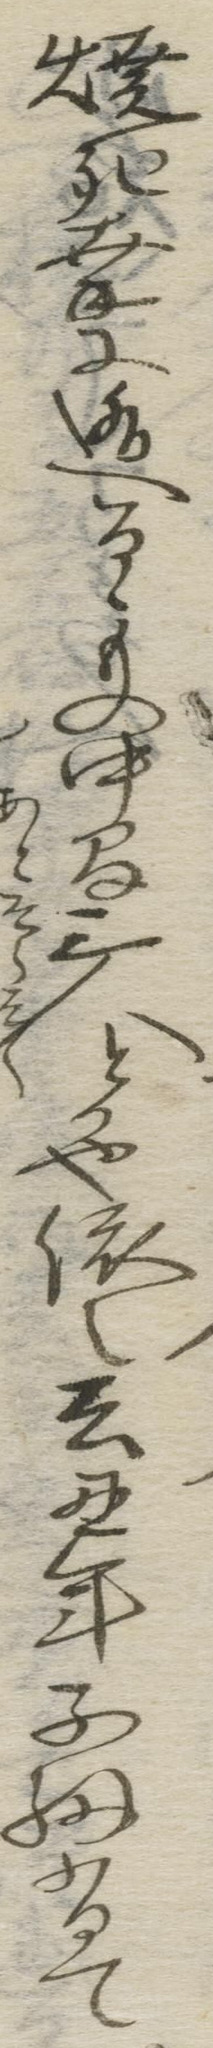焼死幸に逃るるもの中間三人とかや依之去丑年子細有て
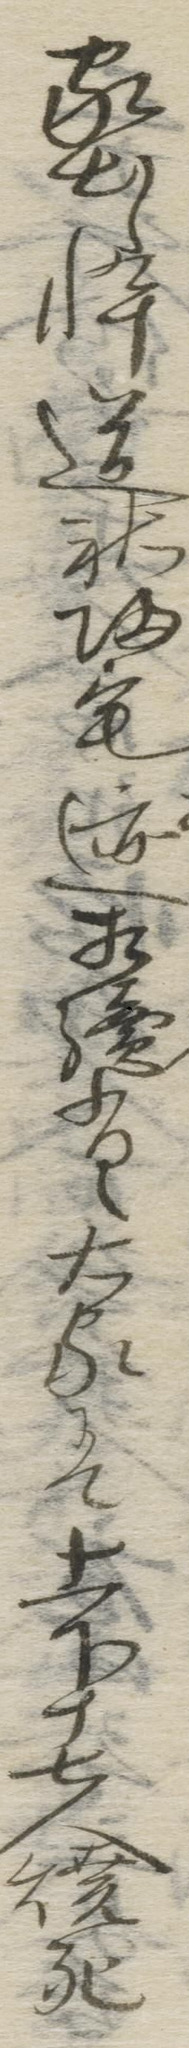家出之伜道祐帰宅迹相続有之右家にて上下十七人焼死
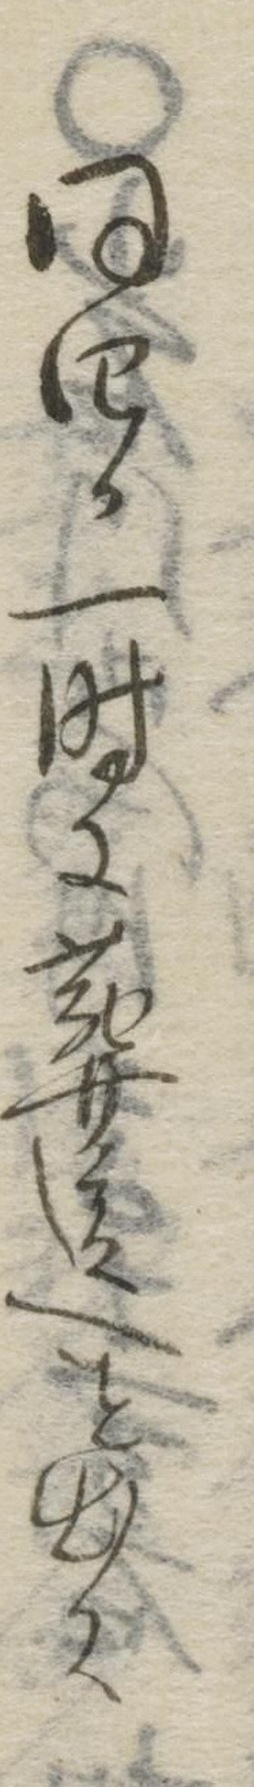同四日一時に葬送を出ス
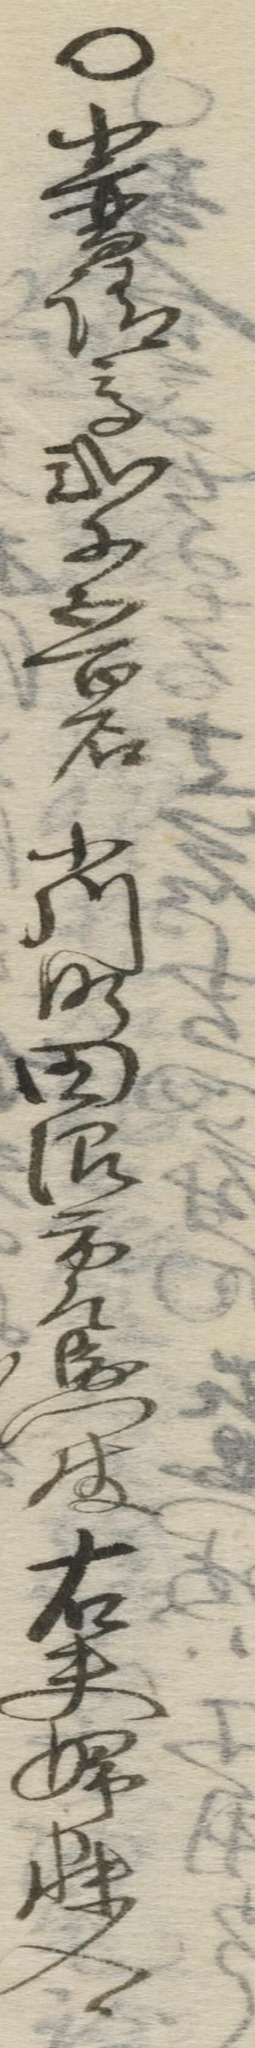○小普請高弐千五百石小川町田沼市左衛門殿右夫婦寝入候
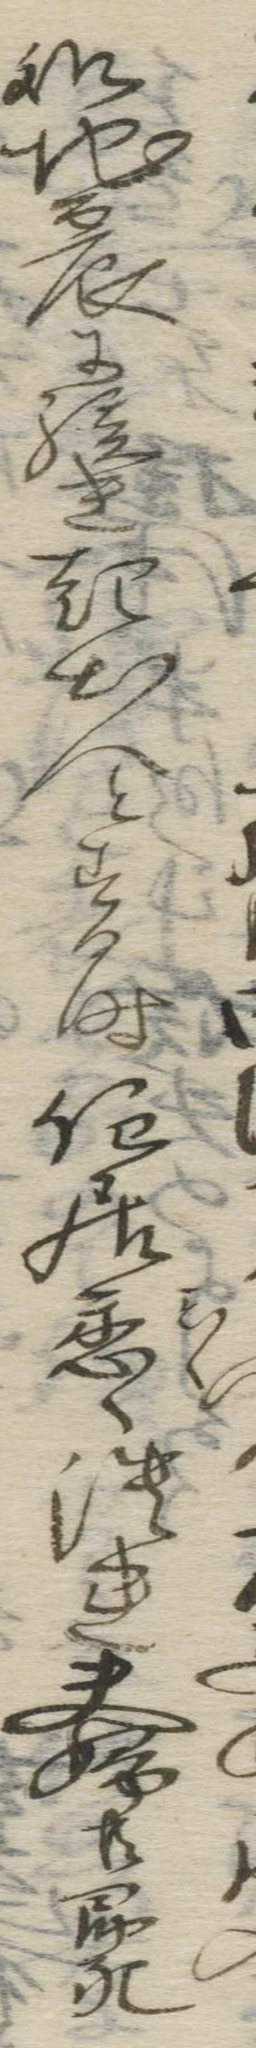処地震に駭き起出んとする時住居悉く潰れ夫婦共即死
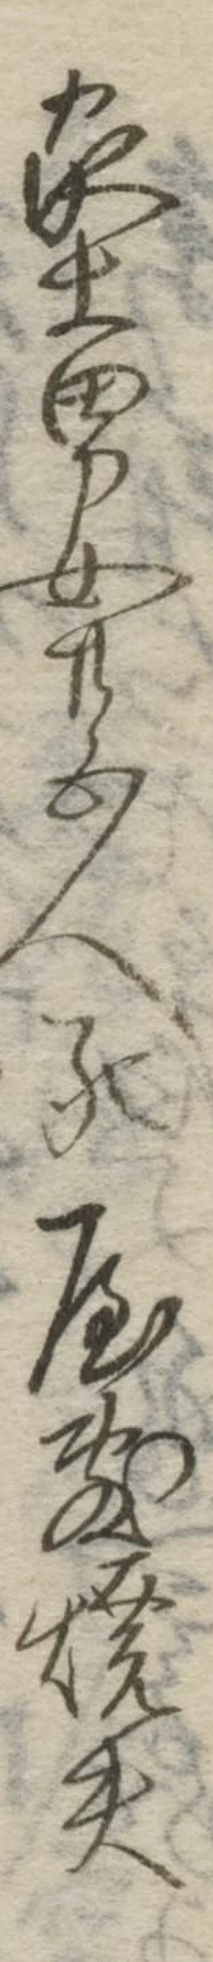家士男女廿五人死屋敷焼失
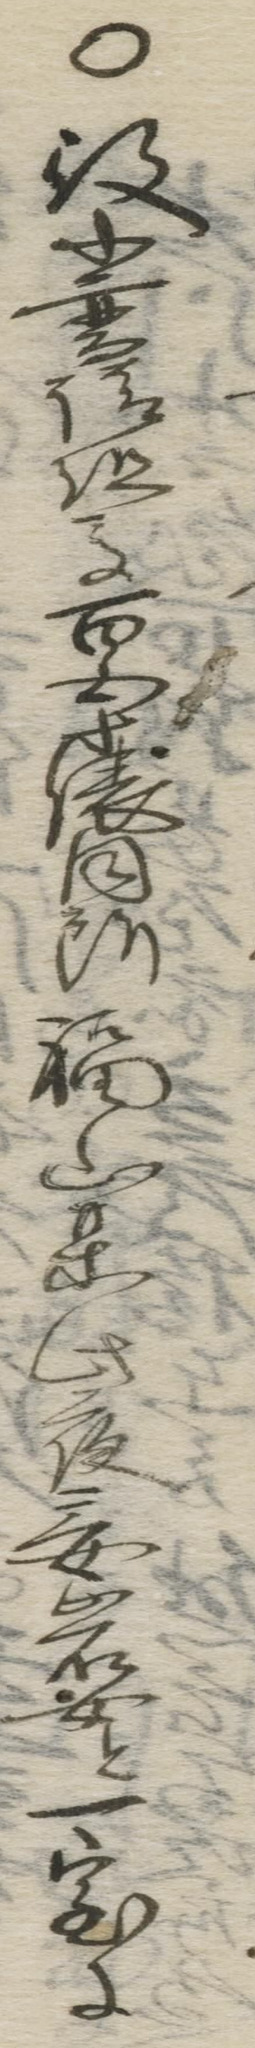○役小普請組高百五十俵同所福山某此夜妾岩女と一室に
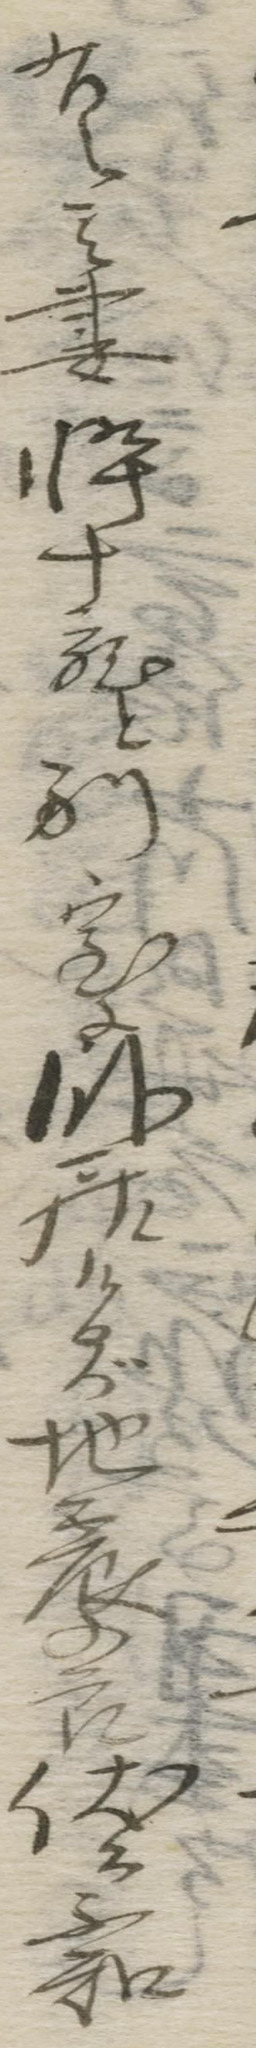有之其妻悴十蔵と別室に臥居けるが地震の節伏而不知
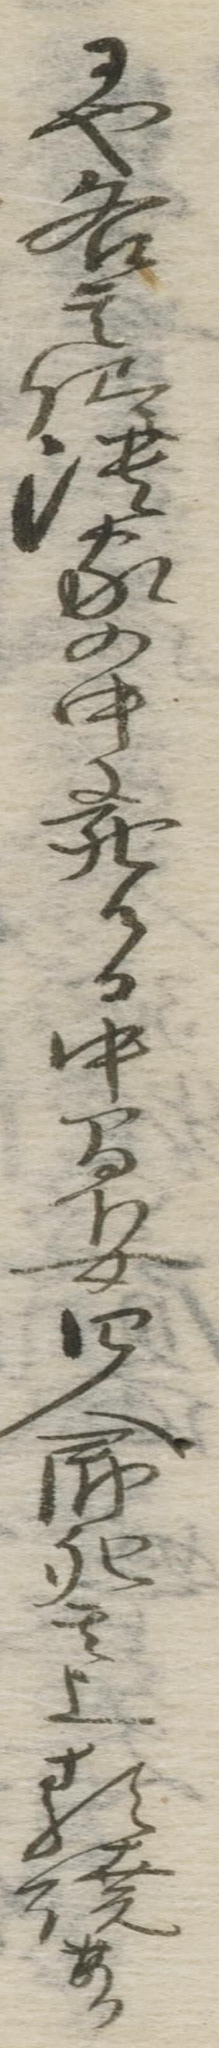にや各其侭潰家の中に死ける中間下女四人即死其上類焼あり
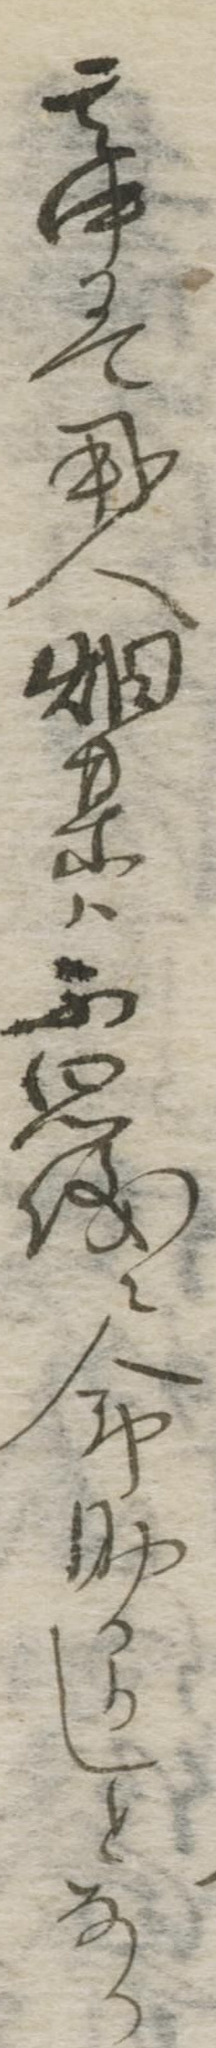其中にて用人畑某ハ不思議ニ命助かりしとなり
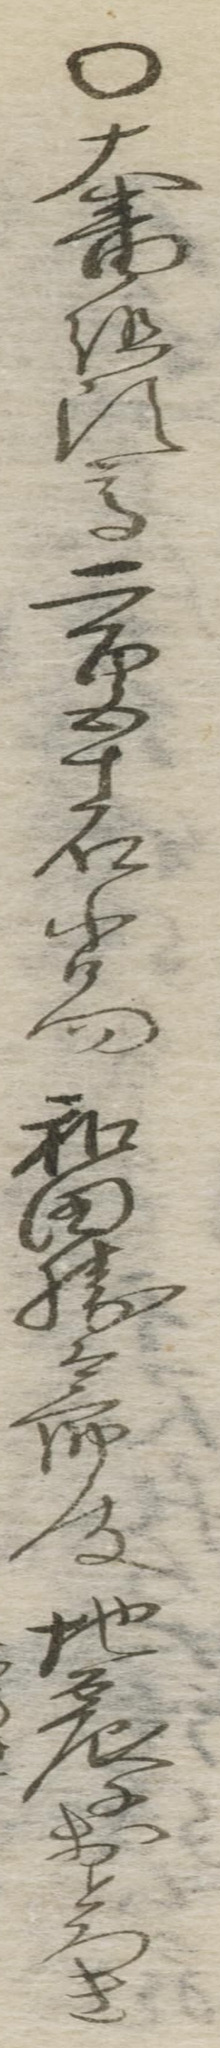○大番組頭高二百五十石小日向和田勝太郎殿地震におとろき
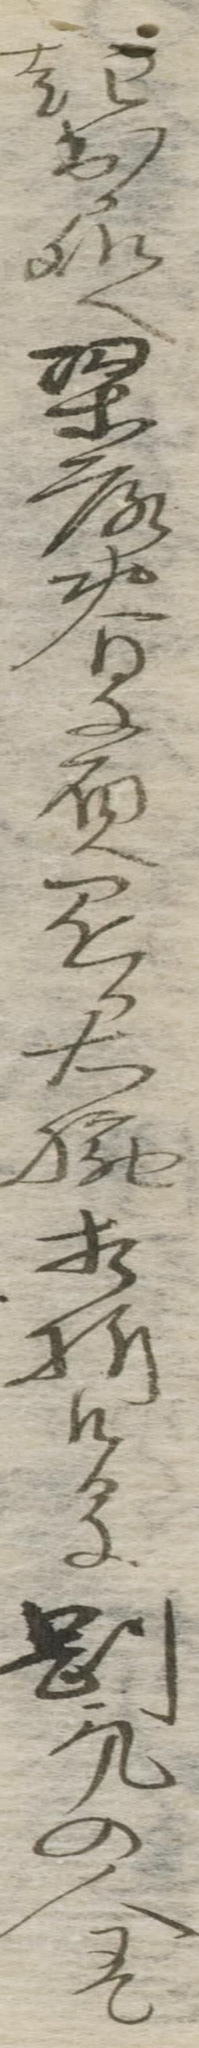起出る処へ梁落背に負懸り右腕相折けるに剛気の人にて
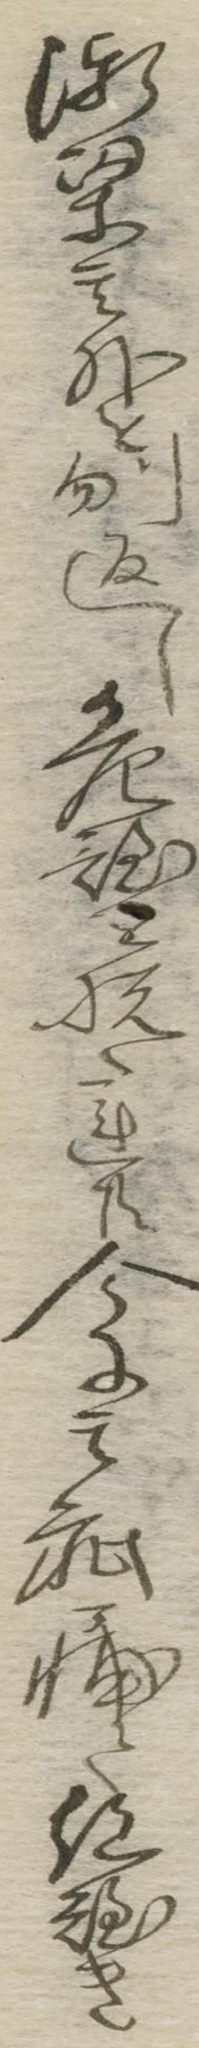漸梁其外を刎返し危難を脱たれ共今に其疵痛て絶難き

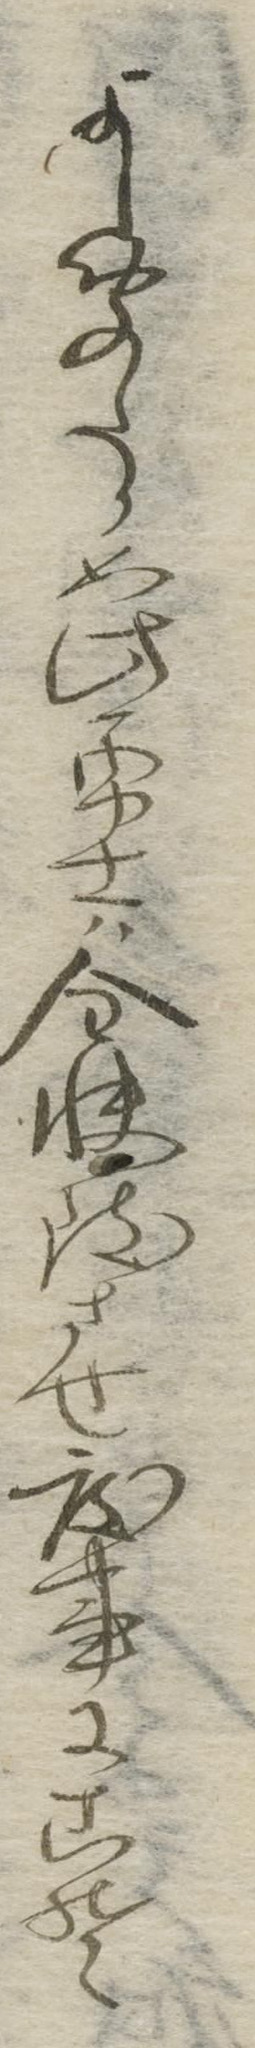よし聞たり如此勇士ハ全快致させ度事にこそ
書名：江戸中諸屋敷　地震竒談録
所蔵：東京大学地震研究所図書室 Earthquake Research Institute Library, The University of Tokyo, JAPAN
